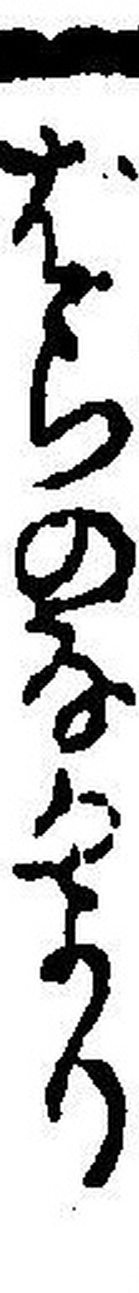はらのなかより
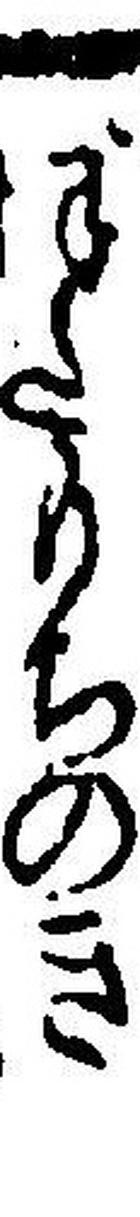ぼたもちのき
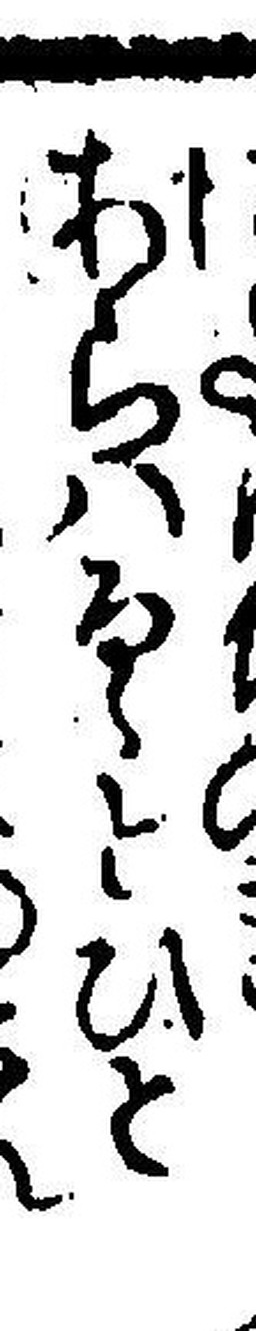あらはるゝとひと
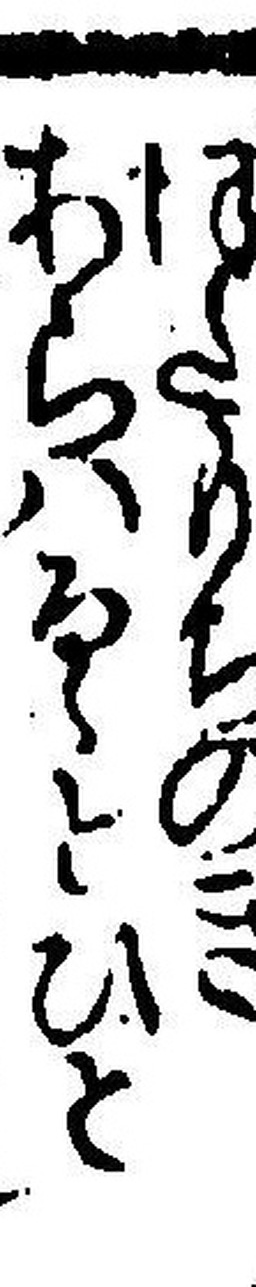あらはるゝとひと
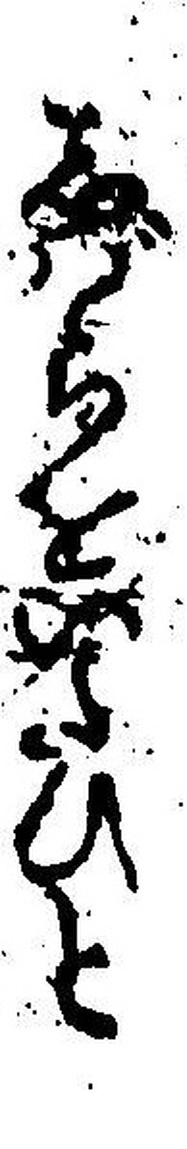しばらをいたひと
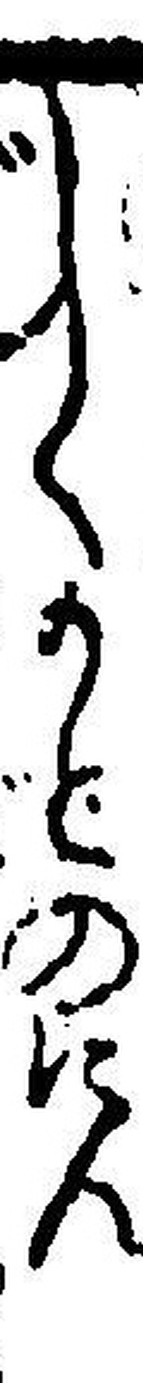しくもとのにん
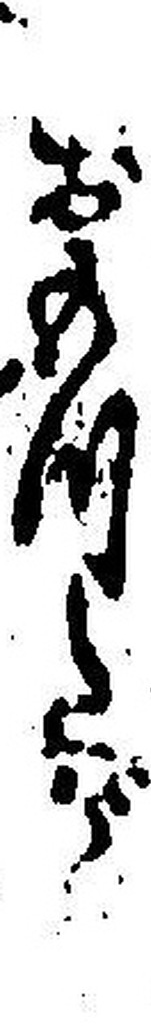おもつたが
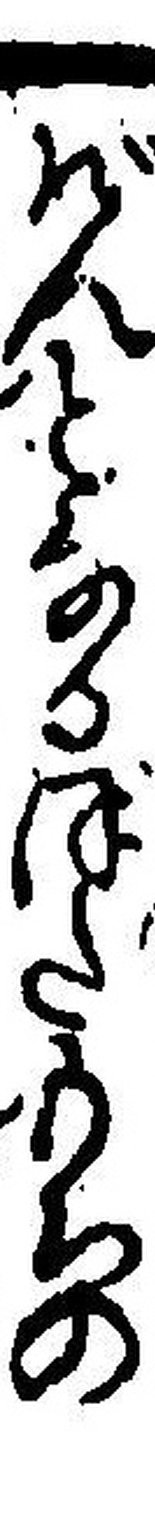げんとなるぼたもちの
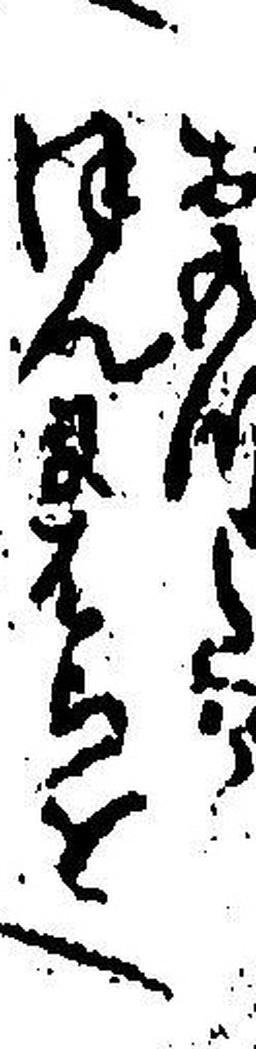ほんにはらを
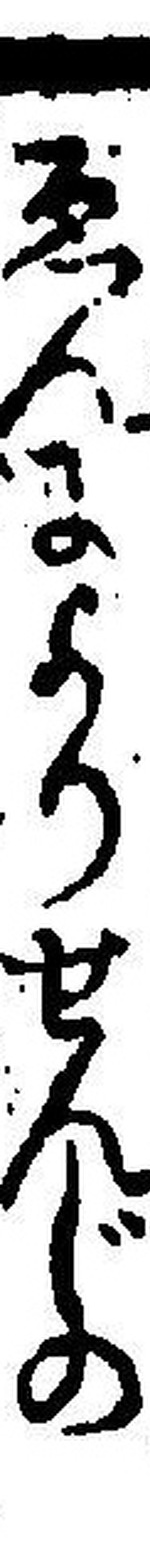ゑんにほりせんじの
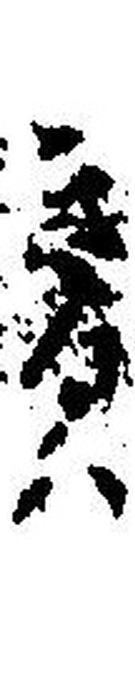きるは
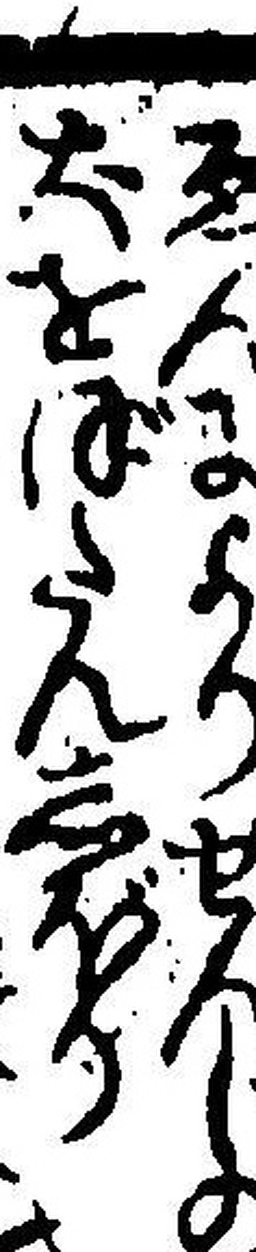犬をぼたんしぼり
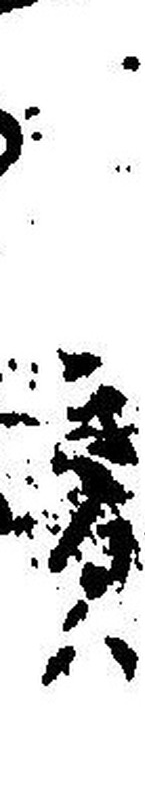きるは
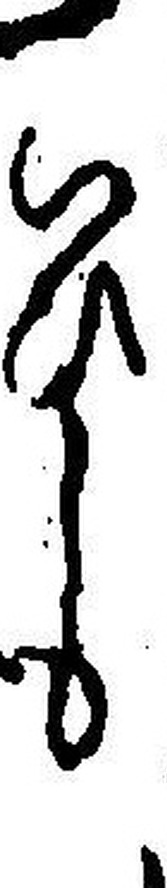いひしも
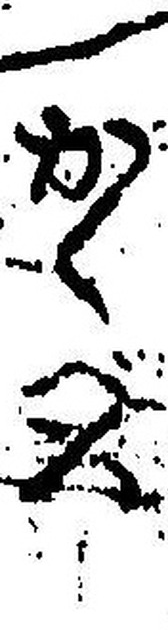かくべつ
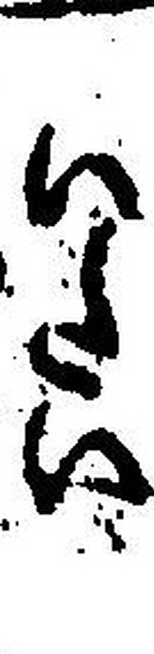いたい
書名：花芳野犬斑 / 山東京伝作
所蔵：東京大学総合図書館 General Library in the University of Tokyo, JAPAN
